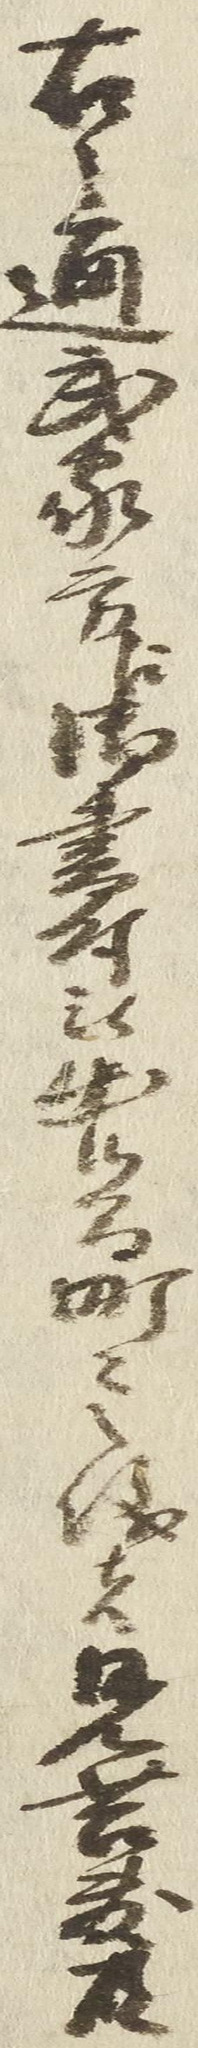右之通武家方江御書付被出候間町々之儀は見苦敷共
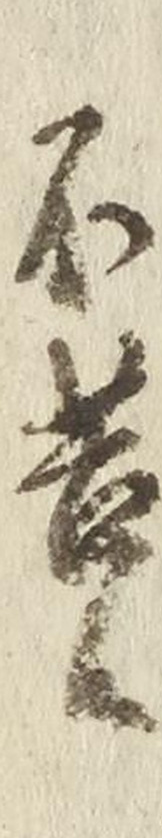不苦候
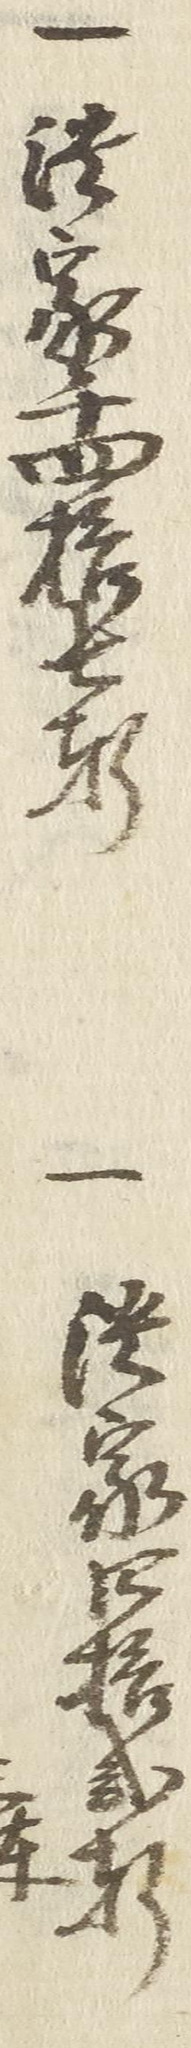一潰家千四拾七軒一潰家四拾弐軒

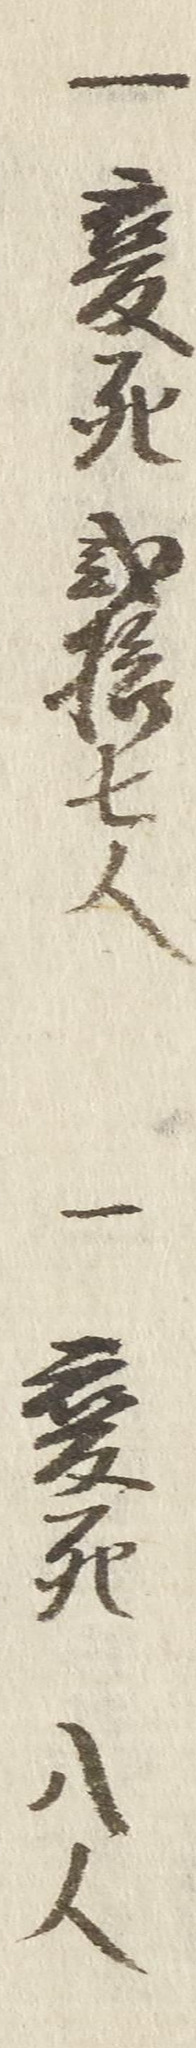一変死弐拾七人一変死八人
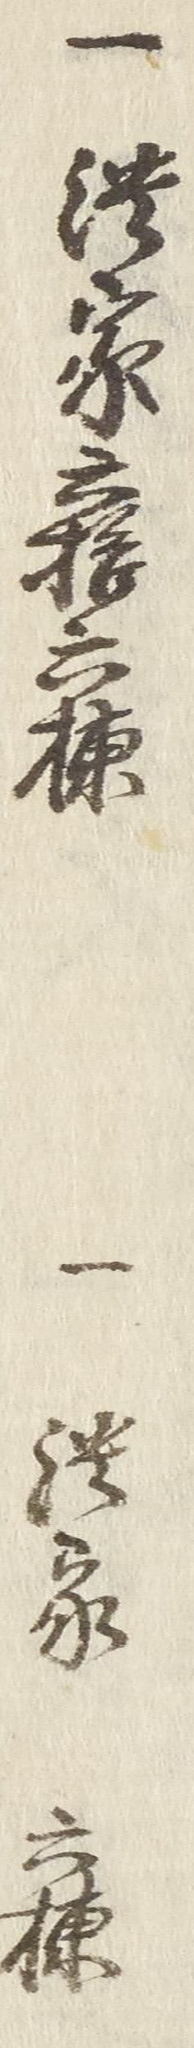一潰家六拾六棟一潰家六棟
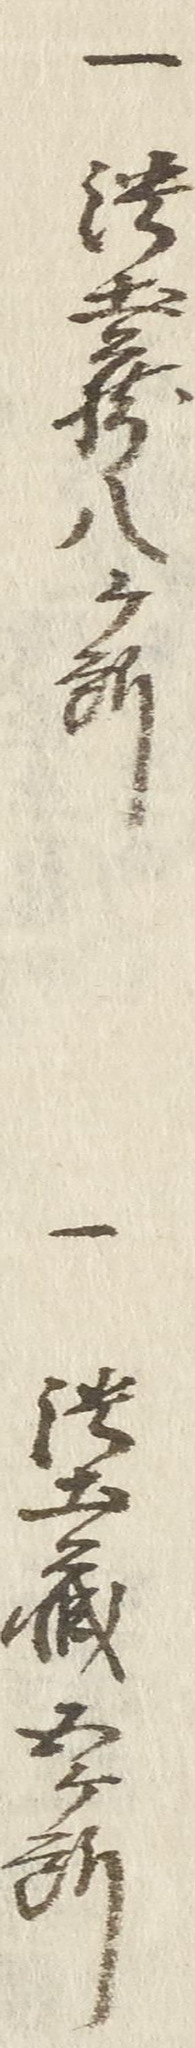一潰土蔵八ヶ所一潰土蔵五ヶ所
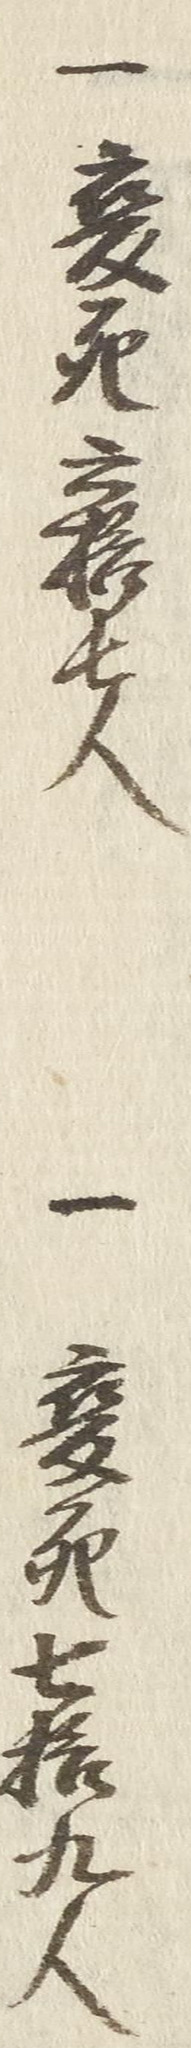一変死六拾七人一変死七拾九人
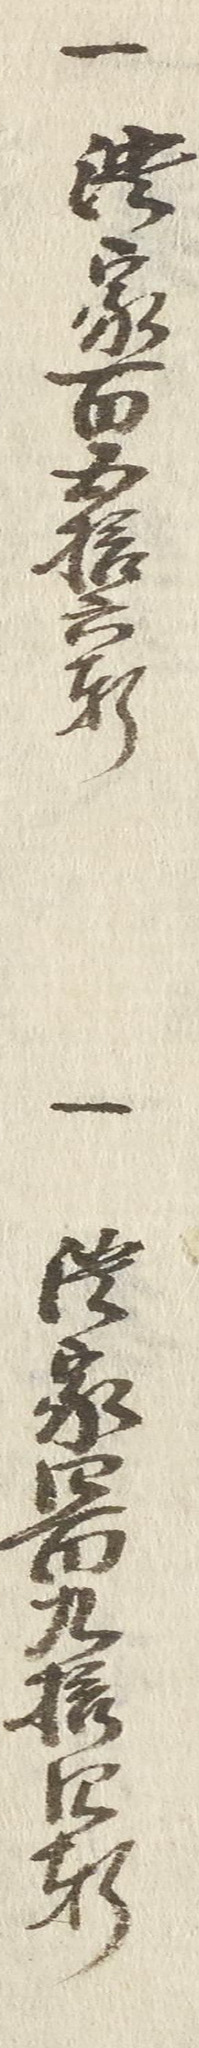一潰家百五拾六軒一潰家四百九拾四軒
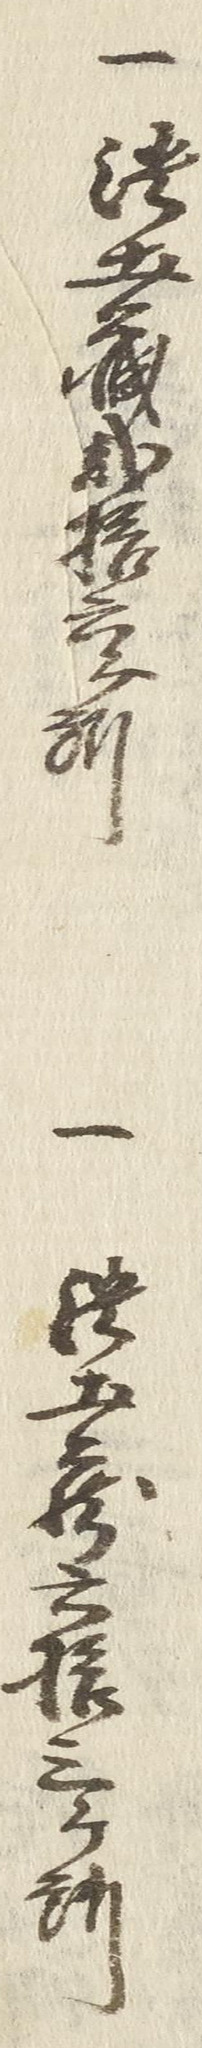一潰土蔵弐拾六ヶ所一潰土蔵六拾三ヶ所
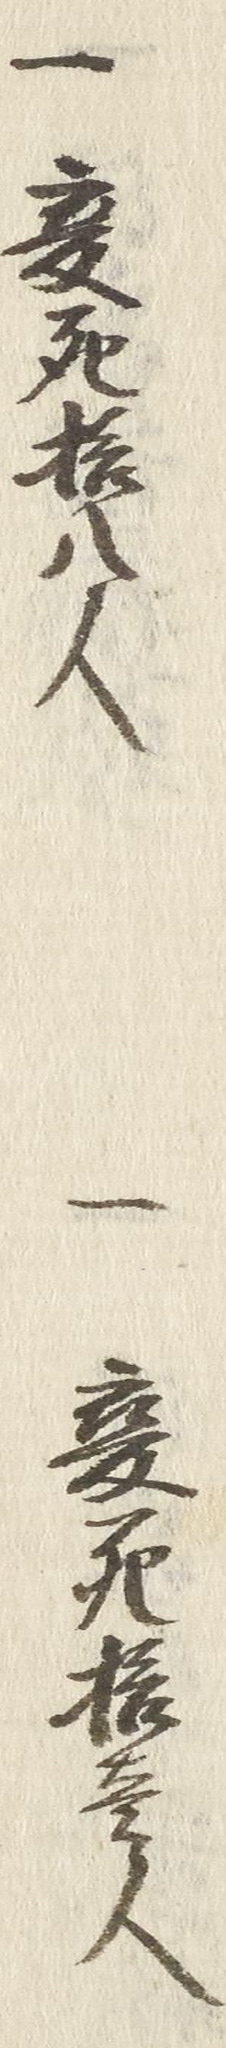一変死拾八人一変死拾壱人
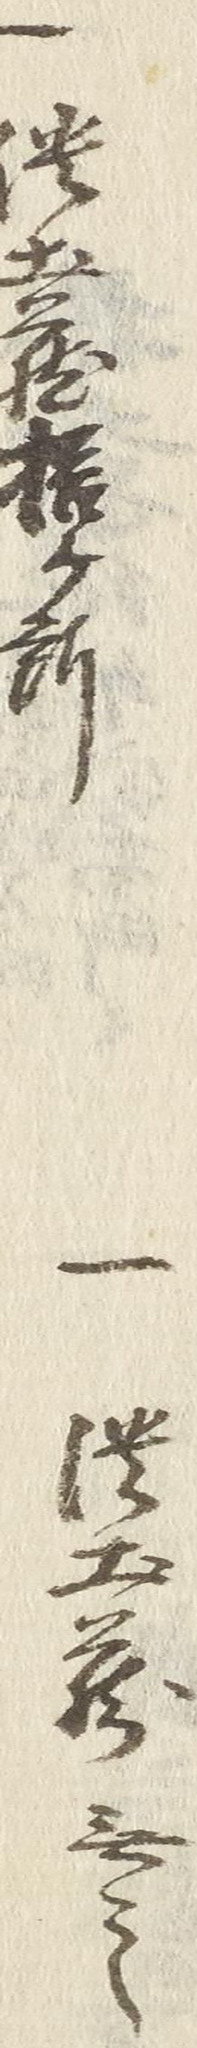一潰土蔵拾ヶ所一潰土蔵無之
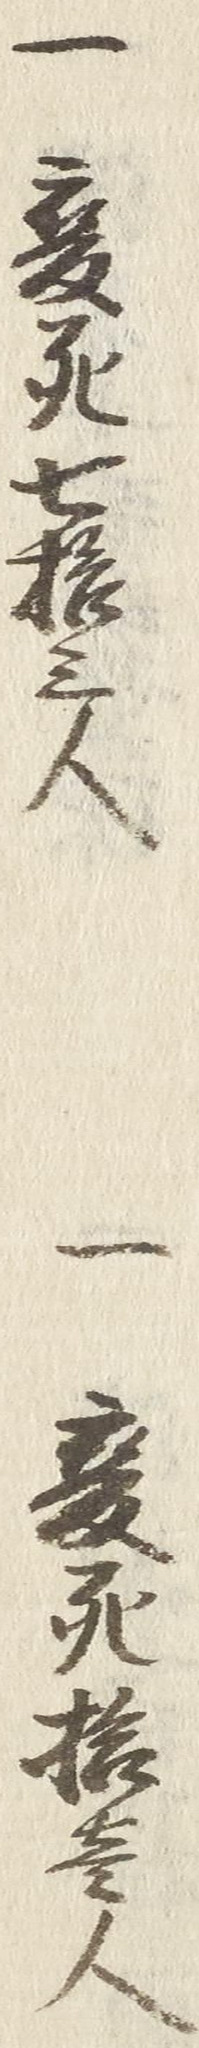一変死拾八人一変死拾壱人
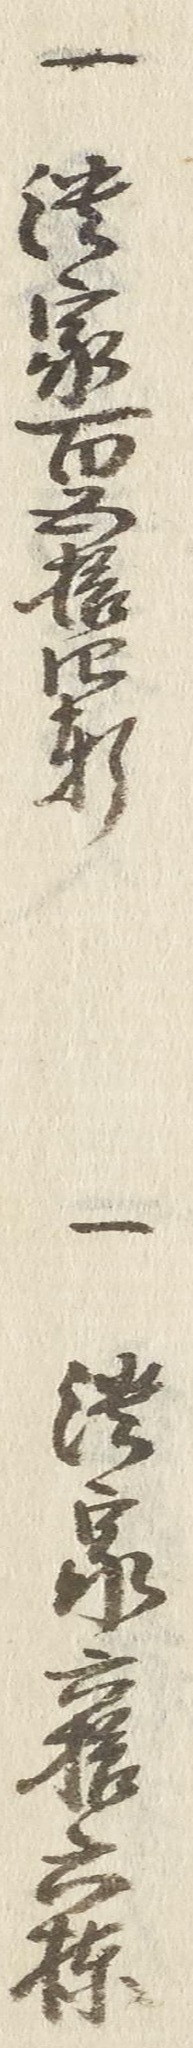一潰家百五拾四軒一潰家六拾六棟
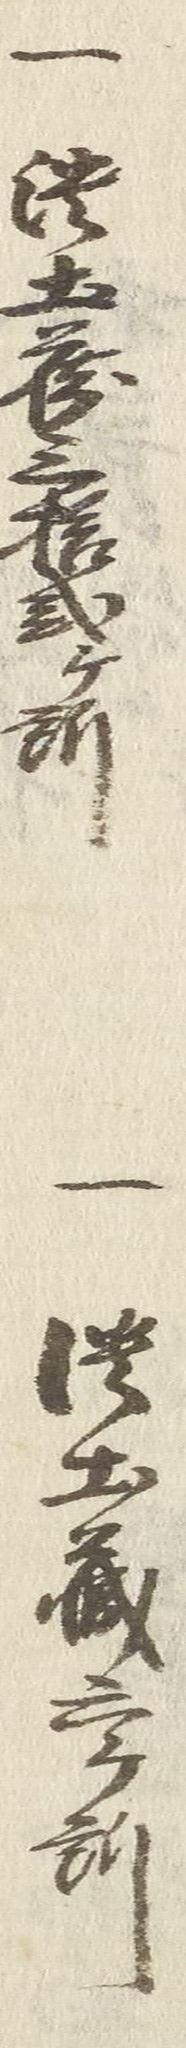一潰土蔵三拾弐ヶ所一潰土蔵六ヶ所

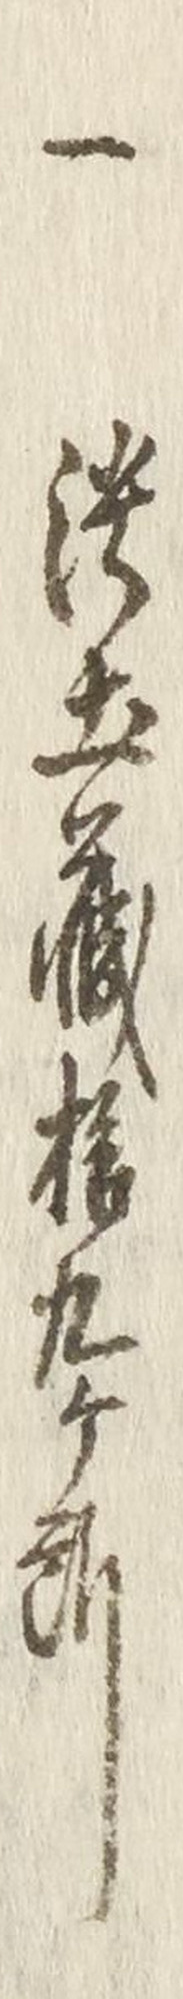一潰土蔵壱ヶ所
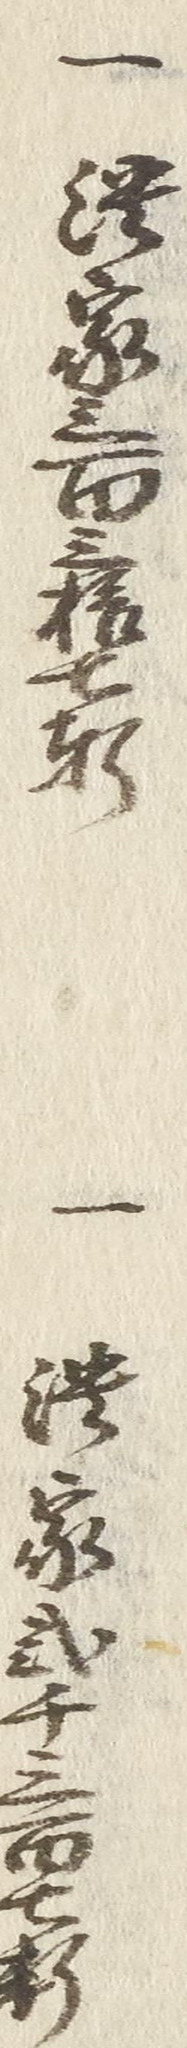一潰家三百三拾七軒一潰家二千三百七軒
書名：従往古地震御届書記誌之一
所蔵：東京大学地震研究所図書室 Earthquake Research Institute Library, The University of Tokyo, JAPAN
